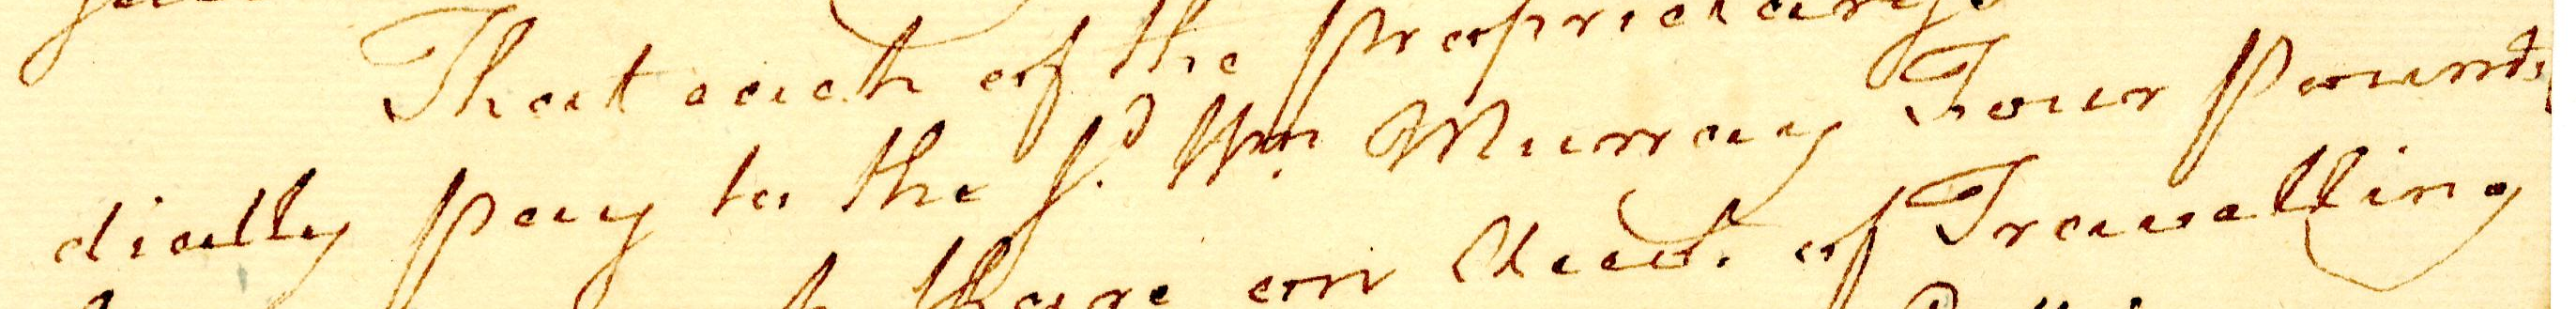-diatly pay to the s^d. W^m. Murray Four permits
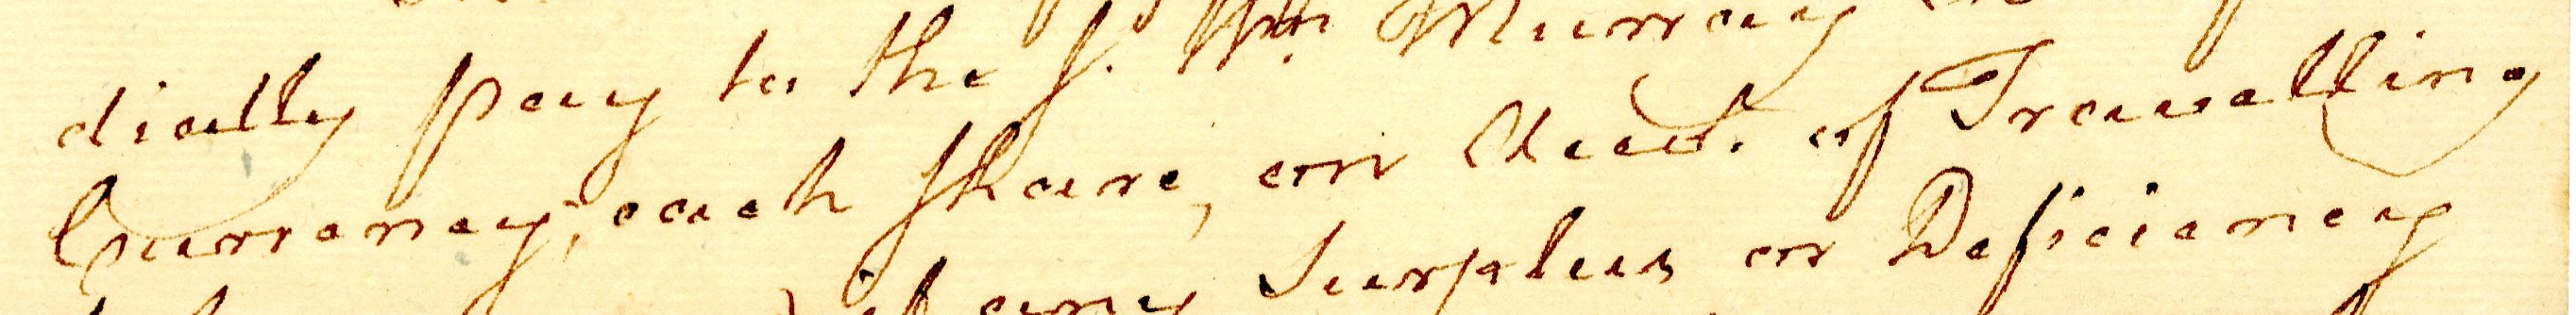Currency each share, on Acco^t. of travalling
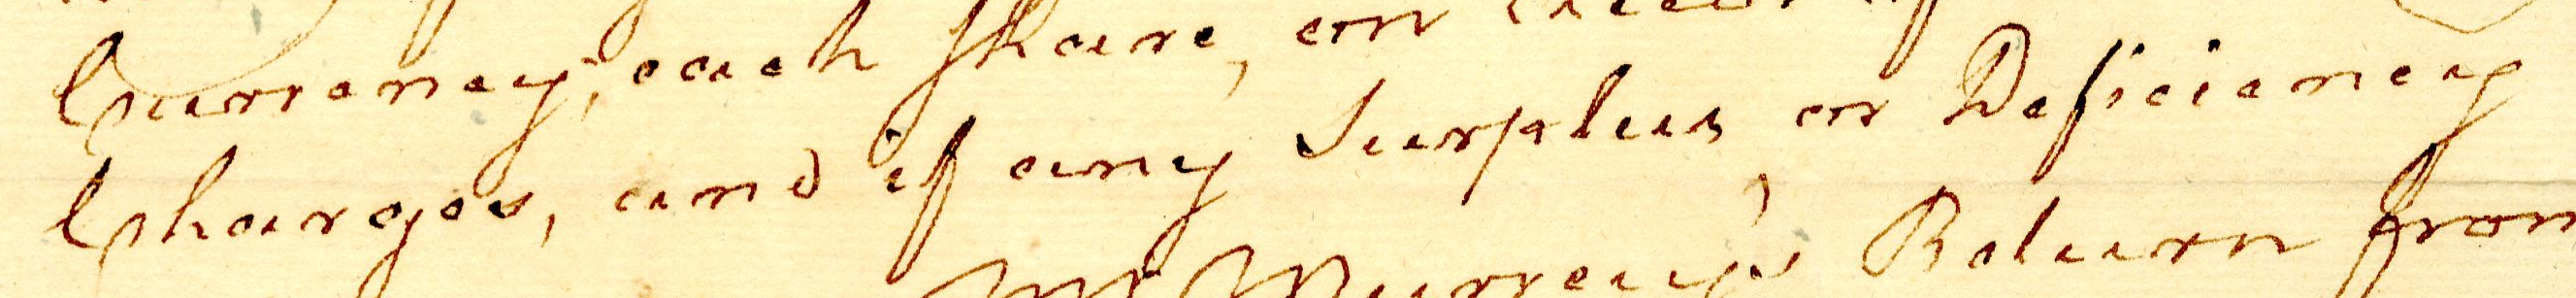Charges, and if any Supplies orr Deficiency
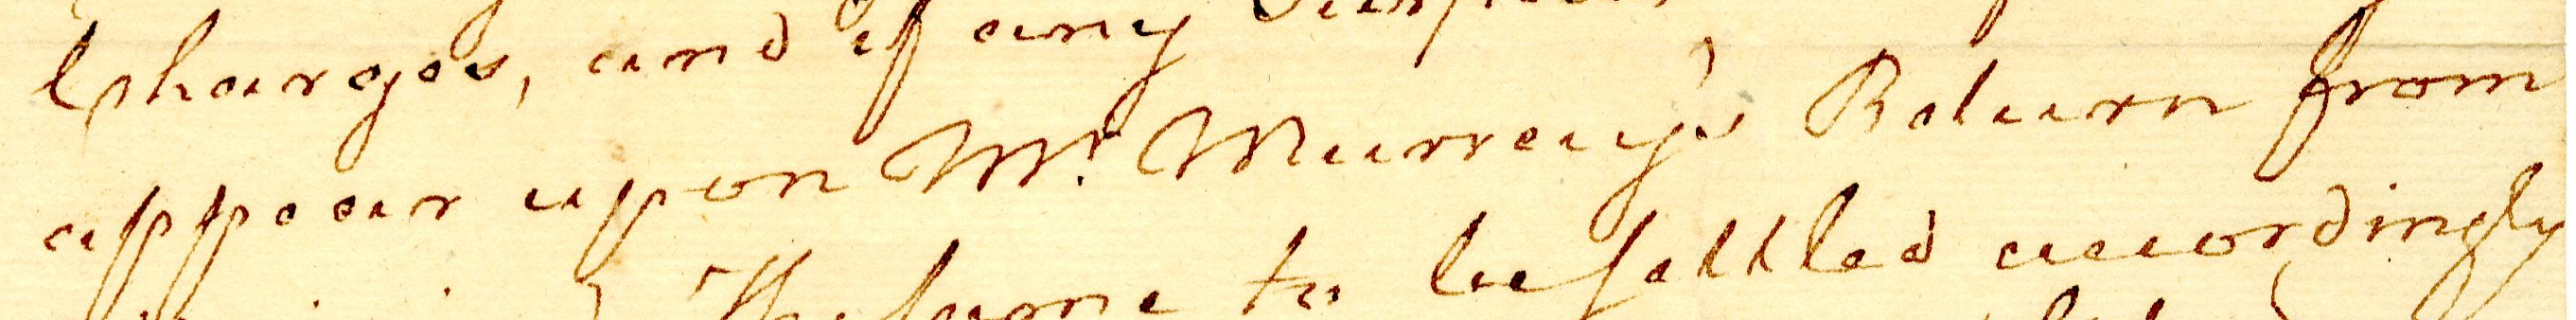appear upon M^r. Murrays Return from
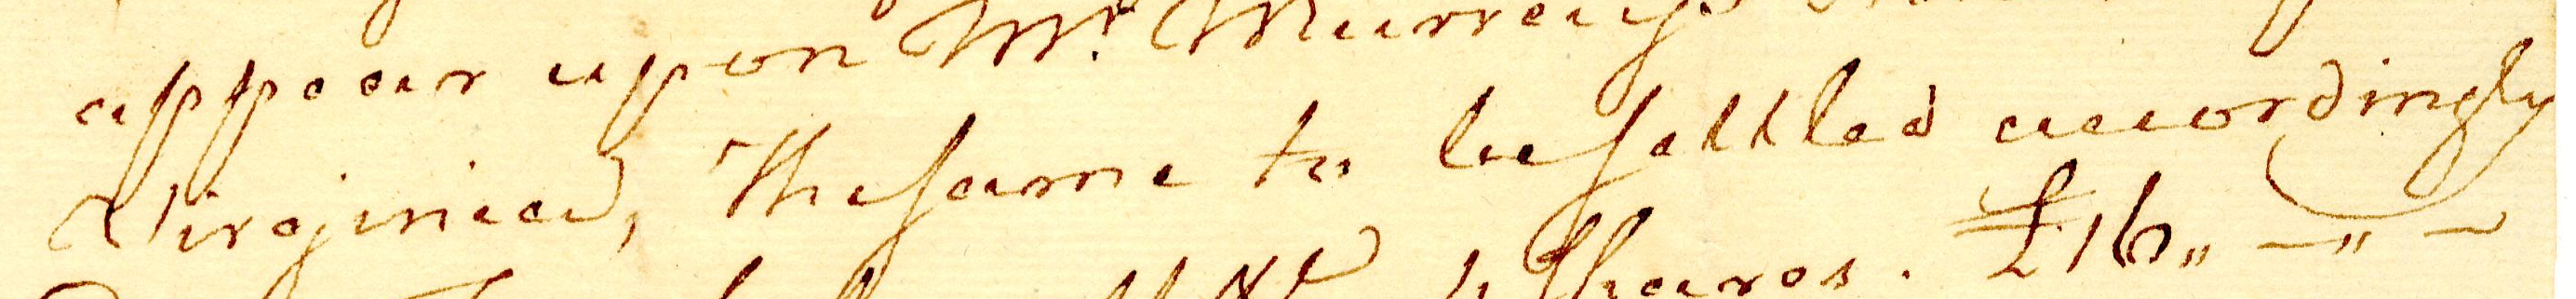Virginia, the same to be settled accordingly
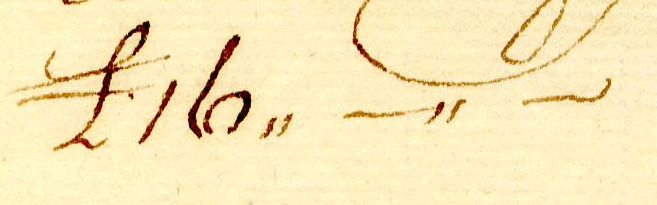£16..-..-
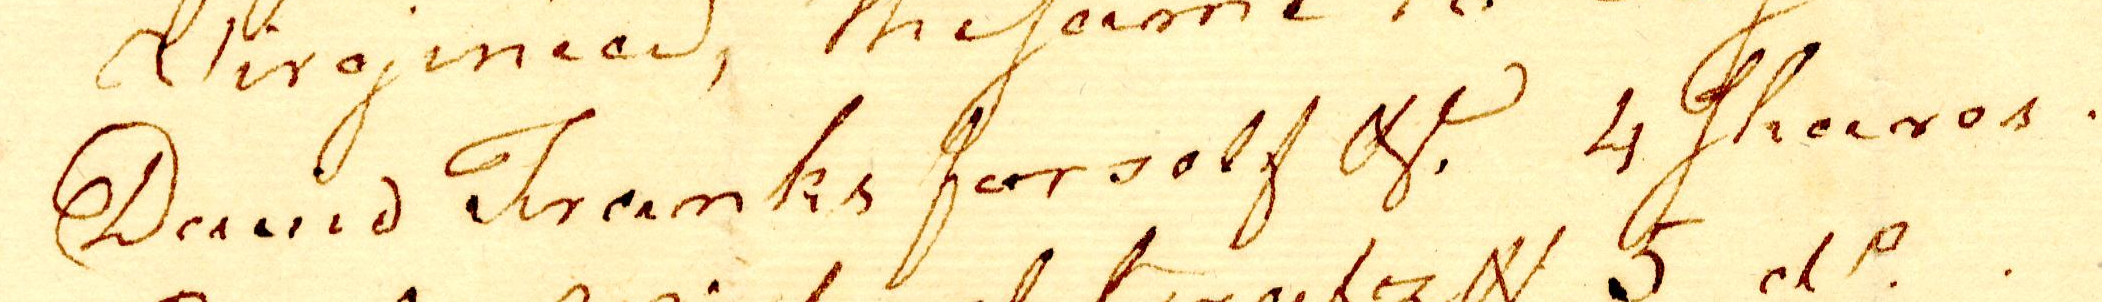Deliv^d Franks for self &^c. 4 shares
